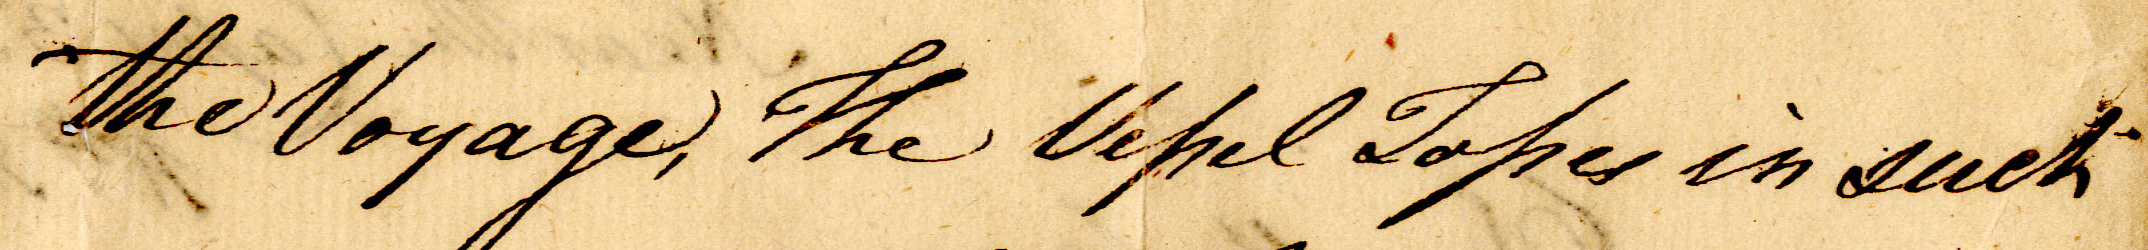the Voyage, the Vessel Tosses in such
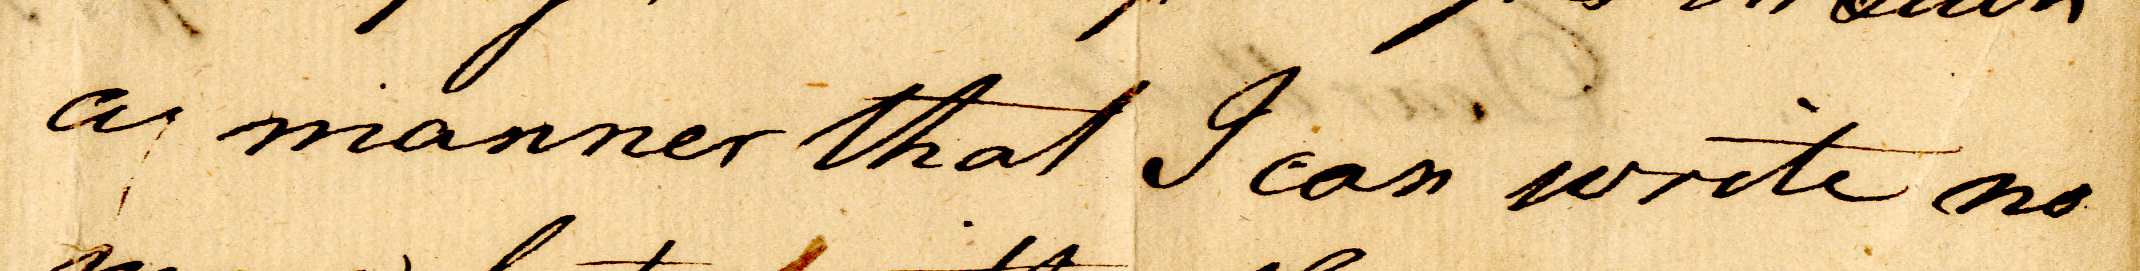a manner that I can write no
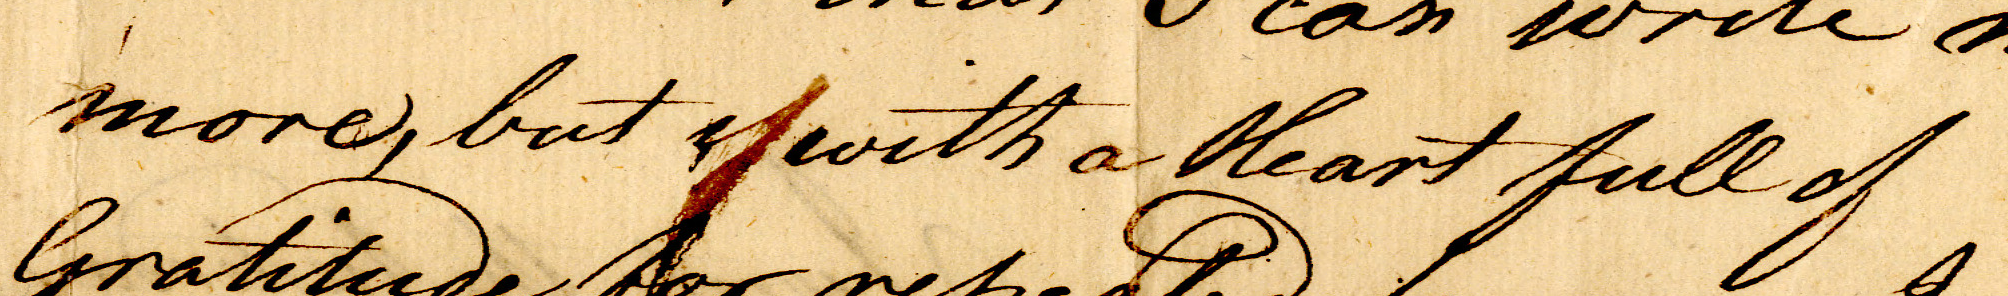more, but with a Heart full of
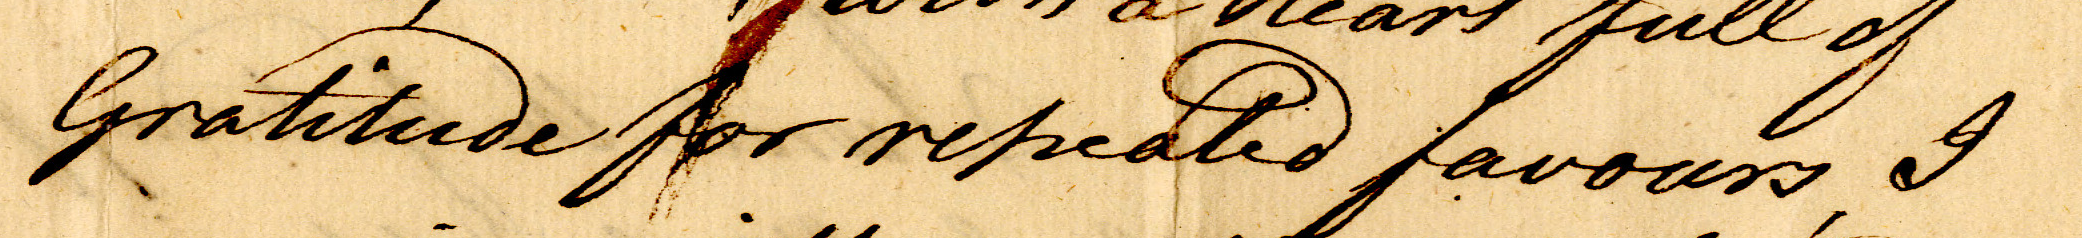Gratitude for repeated favours, I
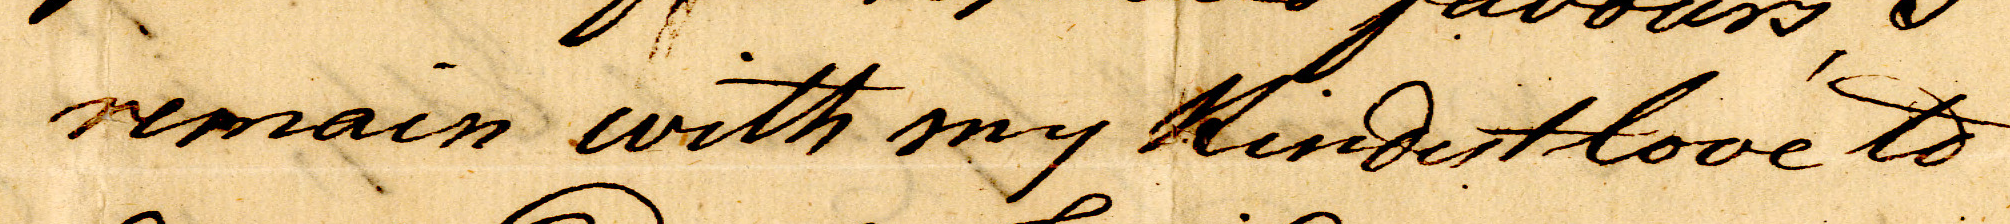remain with my Kindest love to
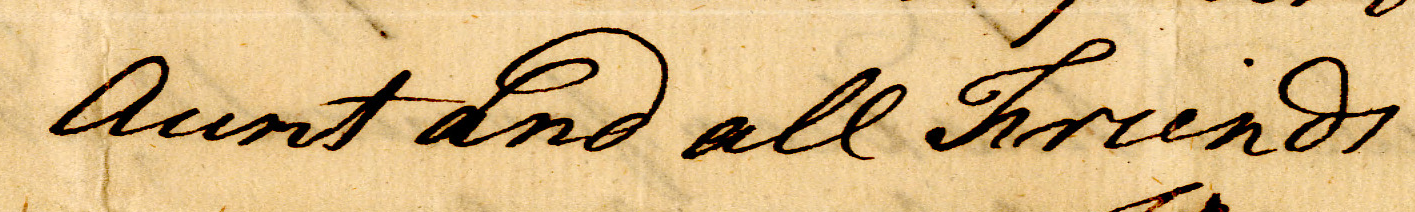Aunt and all Friends
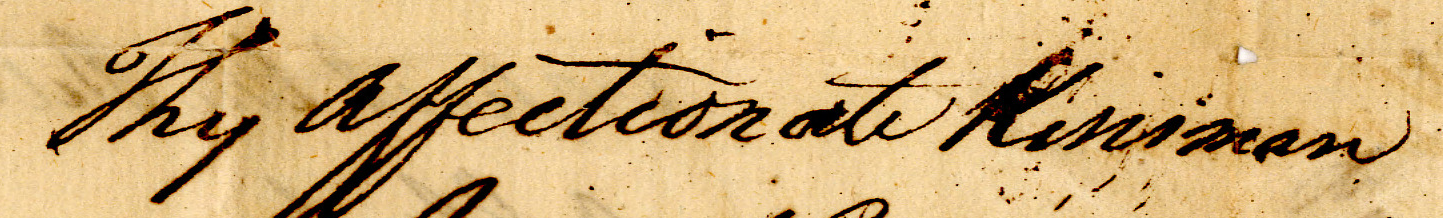Thy affectionate Kinsman
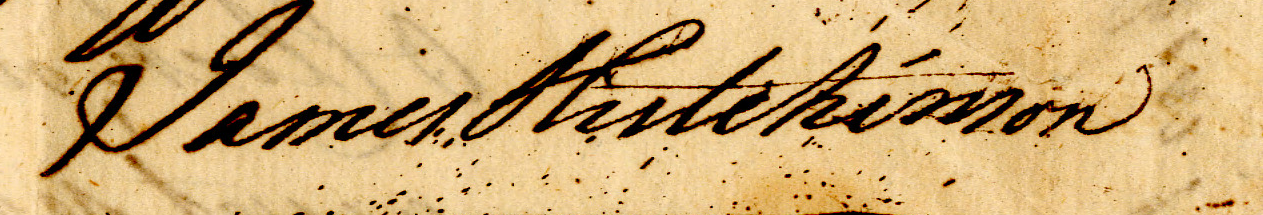James Hutchinson
